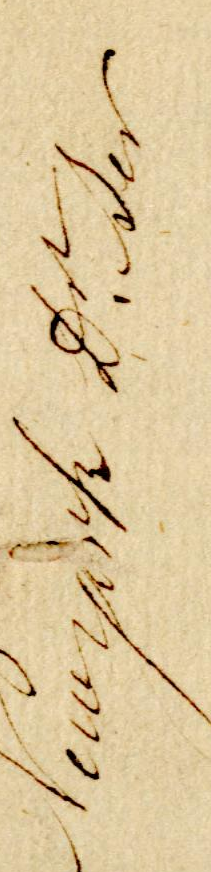New York D^r Ser
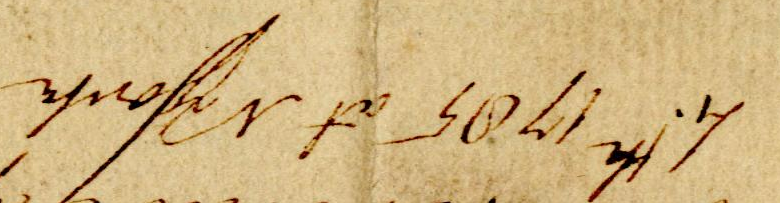4^th 1785 at New York
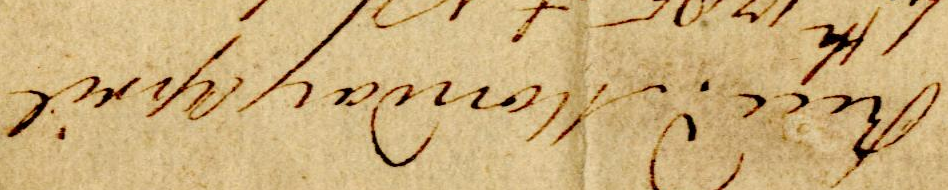Rece^.Monday April
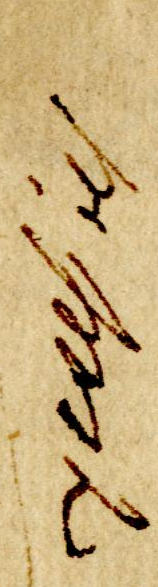M^r post
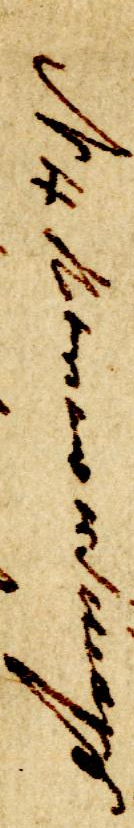N4 known or forward
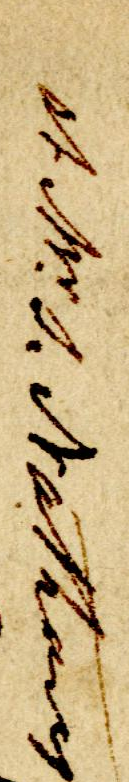at M^r. S. Nathans
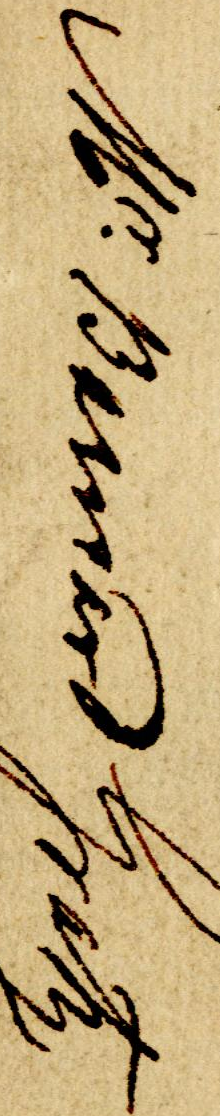M^r Barnard Gratz
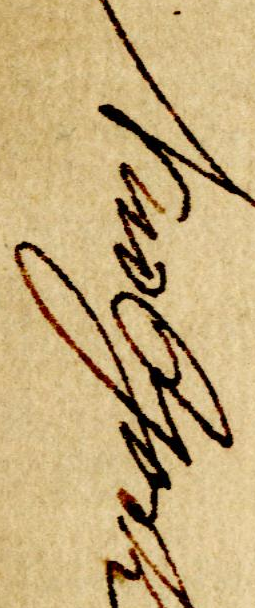New York
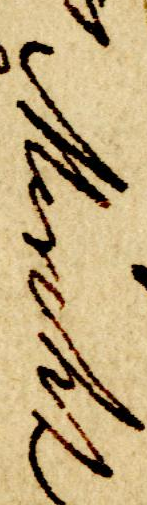Merch^t
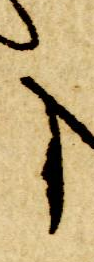2
